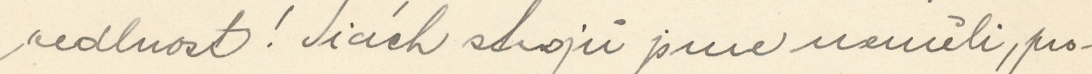vedlnost! Šicích strojů jsme neměli, pro-
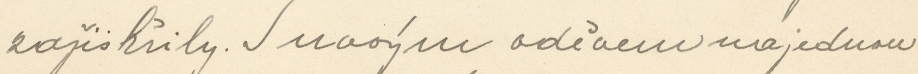zajiskřily. S novým oděvem najednou
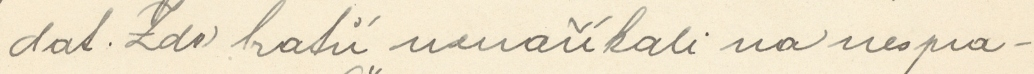dat. Zde bratří nenaříkali na nespra-
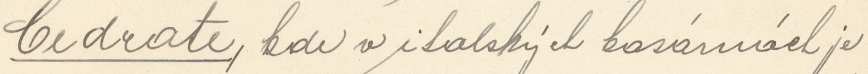Cedrate, kde v italských kasárnách je
